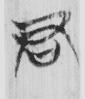君
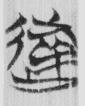{辶止㚔}
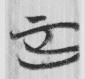正
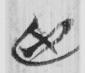臣
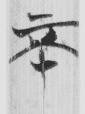不
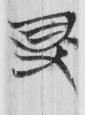𠭁
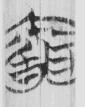{尒䎽}
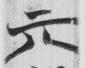亓
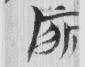所
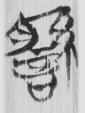䌛
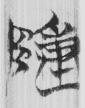陳
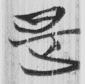是
